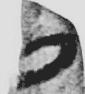㠯（以）
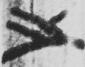之
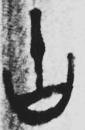古（故）
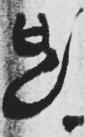也
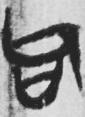句（后）
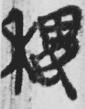稷
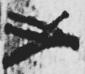之
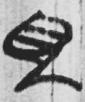見
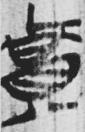貴
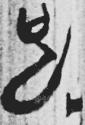也
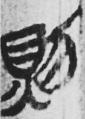則（則）
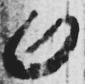㠯（以）
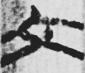文
